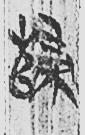{𡴎帚}
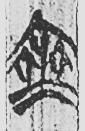齊
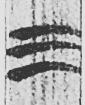三
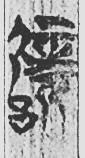辟
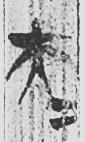夫=
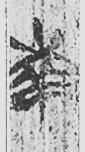南
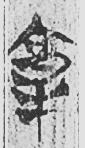𩫏
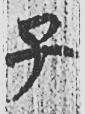子
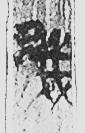{戔阝}
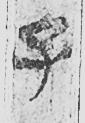子
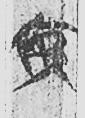安
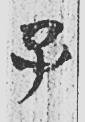子
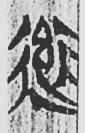{行幺止}
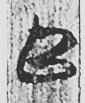𠂤
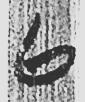㠯（以）
